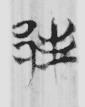邦
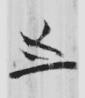之
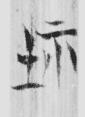社
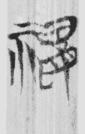禝
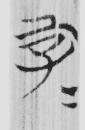乳=
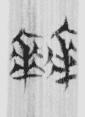拜
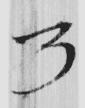乃
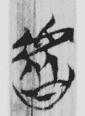{虍皆}
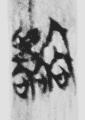臨
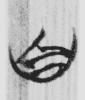自
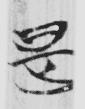是
